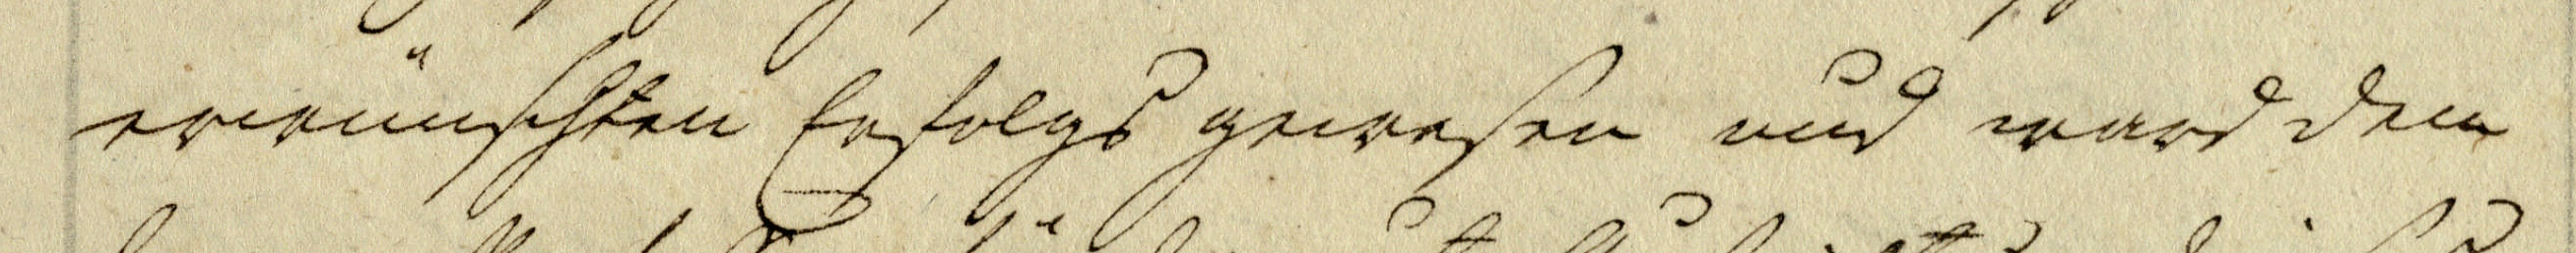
erwünschten Erfolgs gewesen und ward dem
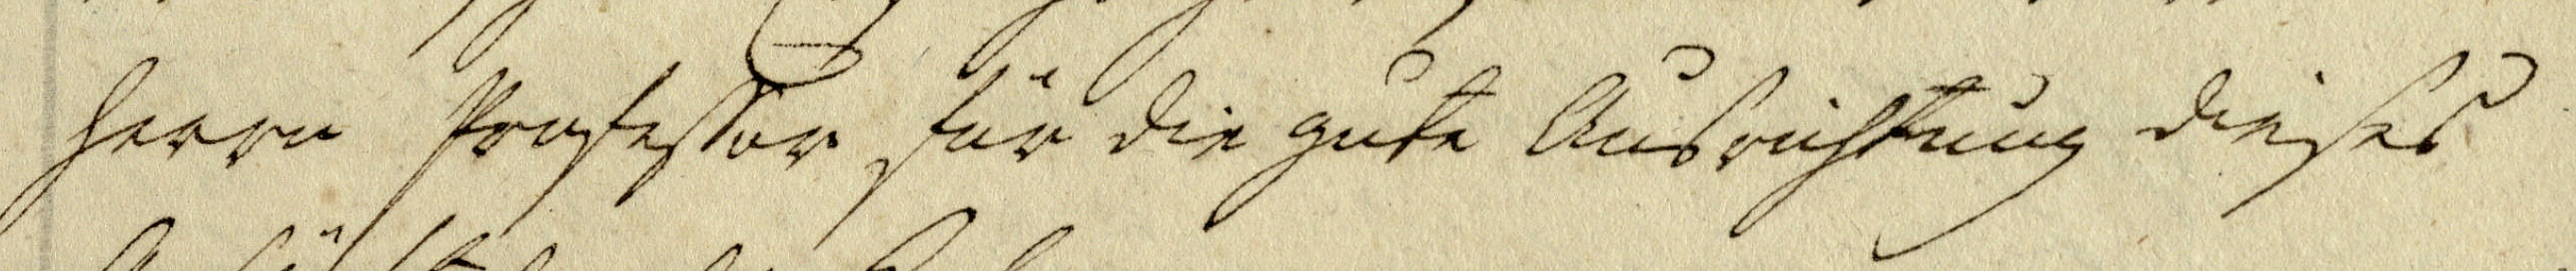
Herrn Professor für die gute Ausrichtung dieses
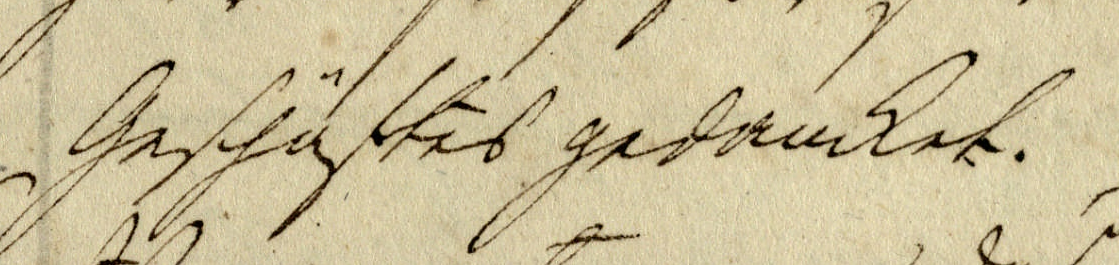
Geschäftes gedancket.
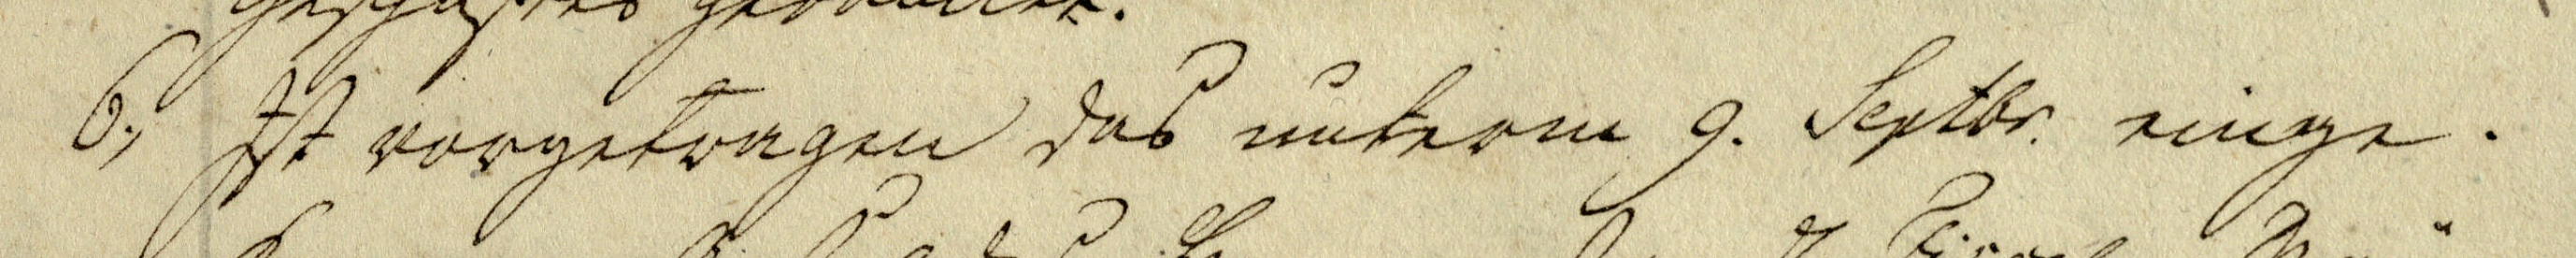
6. Ist vorgetragen das unterm 9. Septbr. einge¬
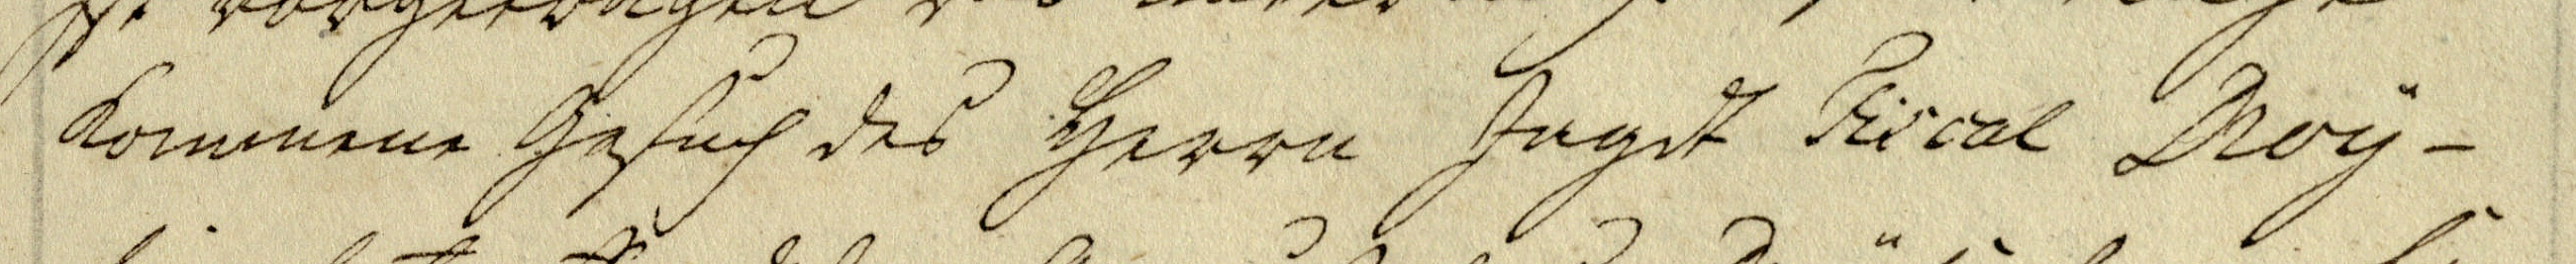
kommene Gesuch des Herrn Jagdt Fiscal Droÿ¬
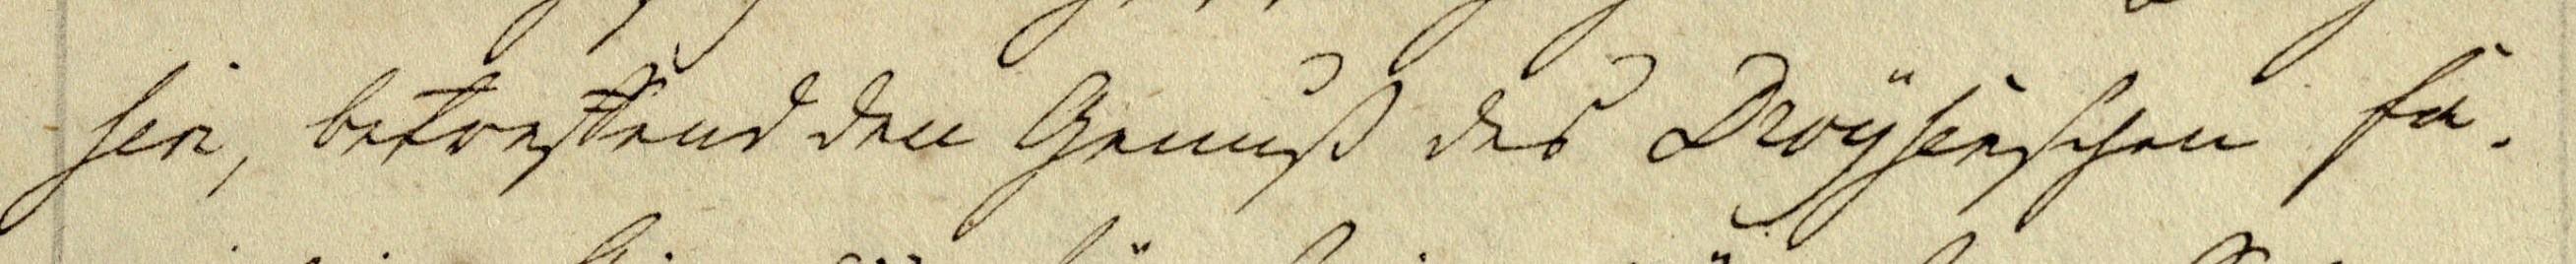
sen, betreffend den Genuß des Doÿsenschen Fa¬
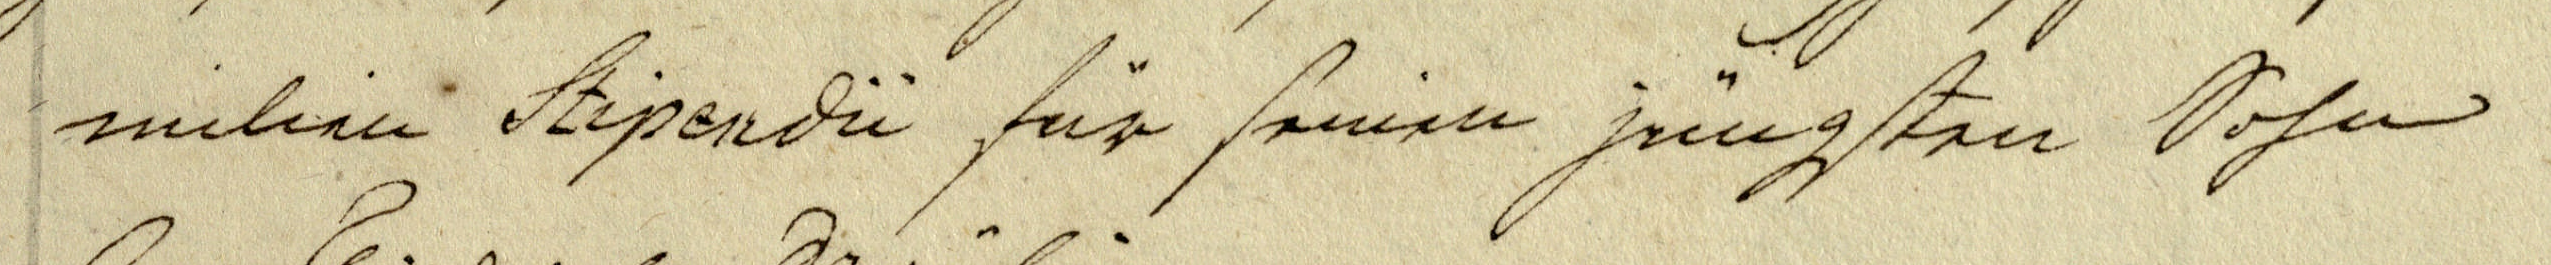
milien Stipendii für seinen jüngsten Sohn
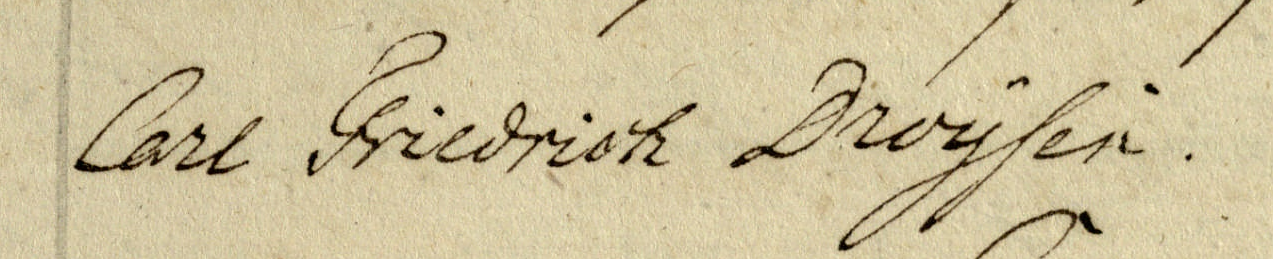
Carl Friedrich Droÿsen.
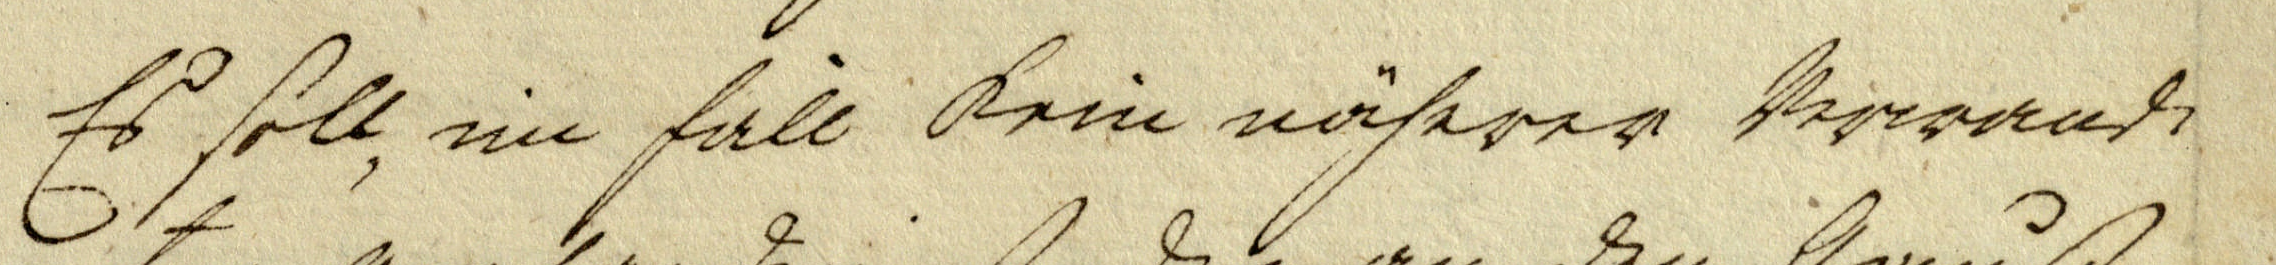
Es soll, im Fall kein näherer Verwand¬
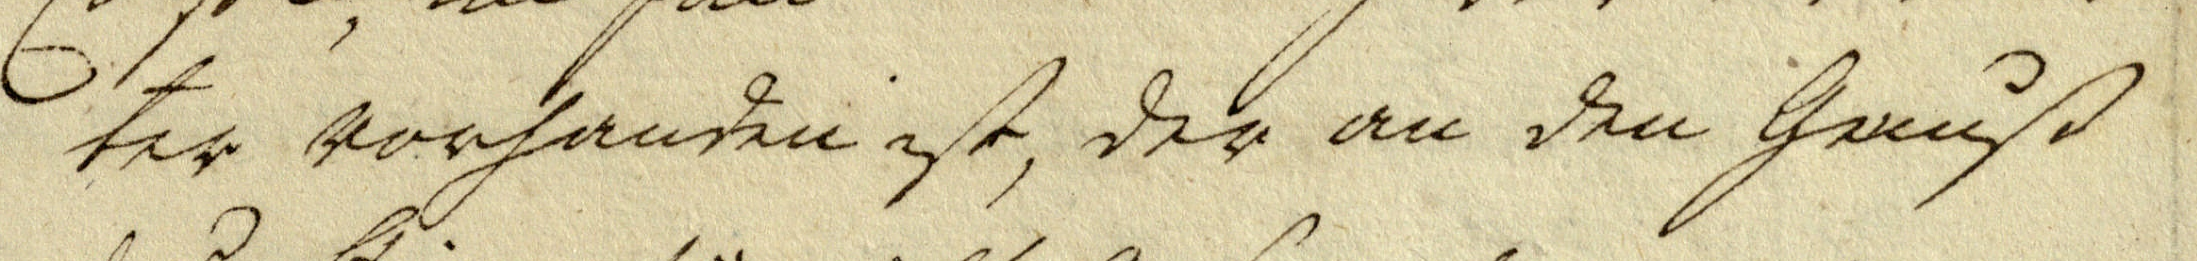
ter vorhanden ist, der an den Genuß
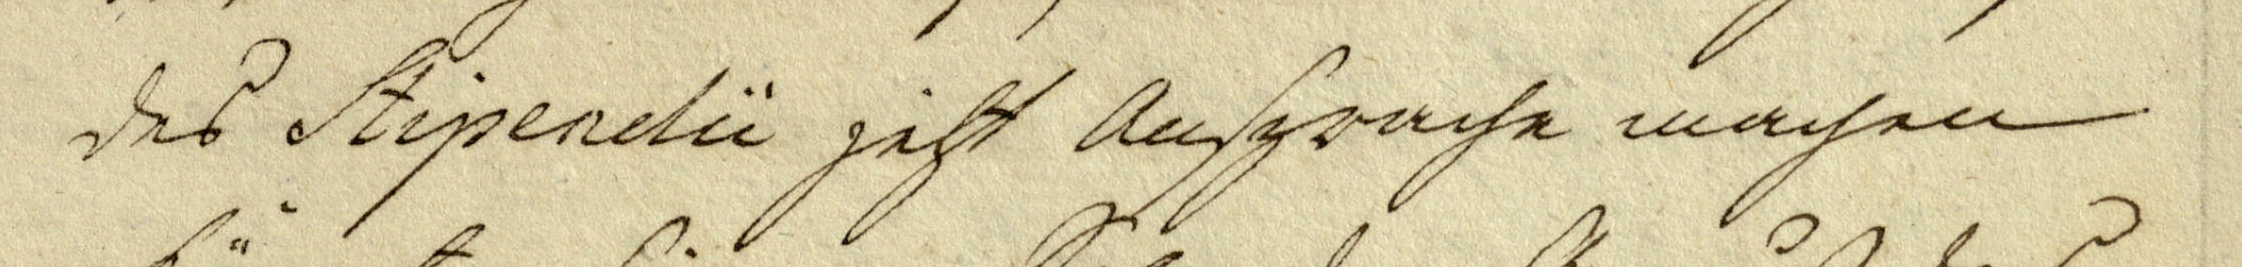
des Stipendii jetzt Ansprache machen
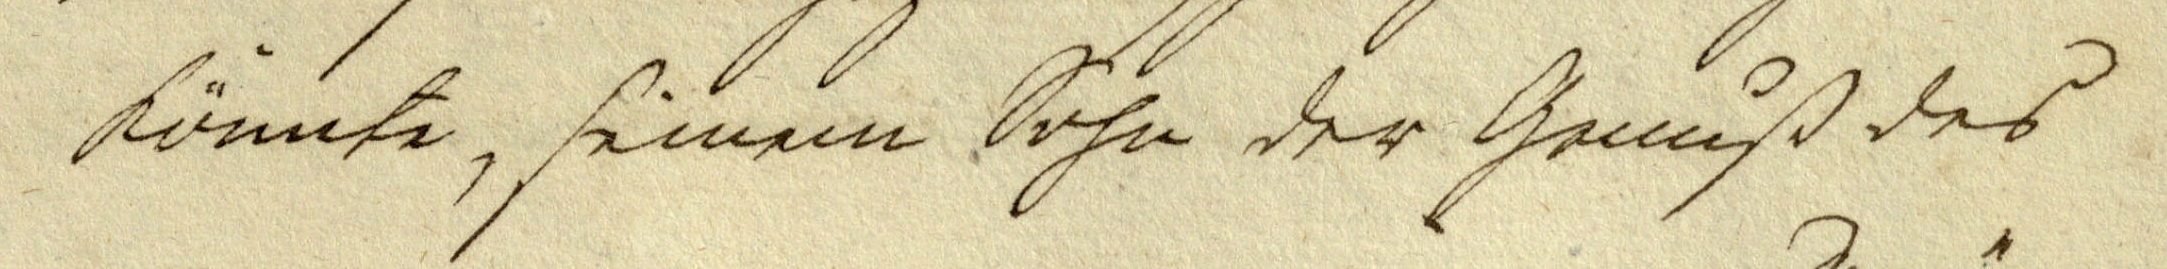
könnte, seinem Sohn der Genuß des
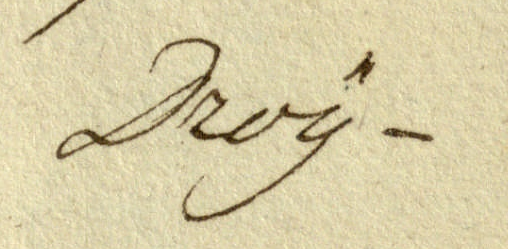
Droÿ¬
